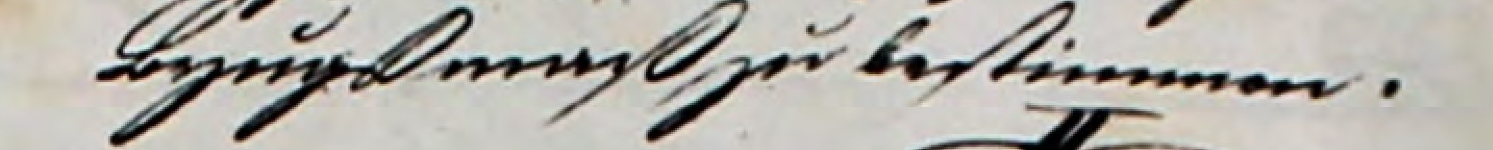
Bezugsmaß zu bestimmen.
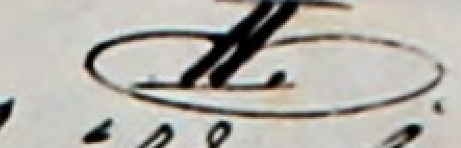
II.
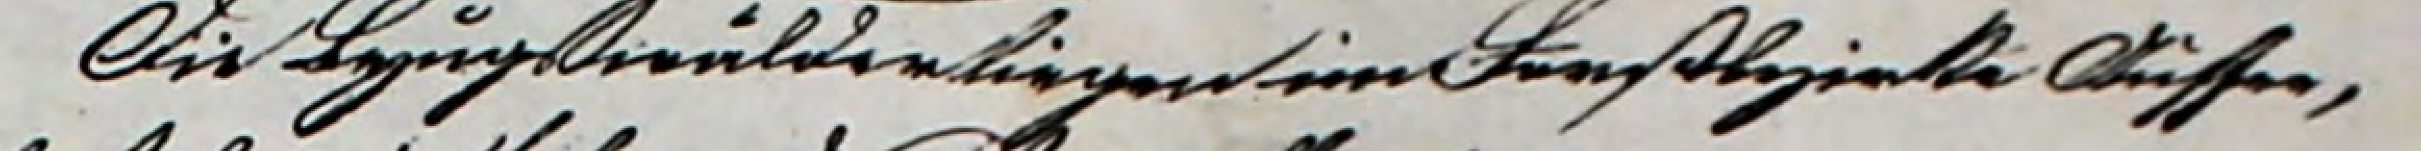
Die Bezugswälderliegen im Forstbezirke Aussee,
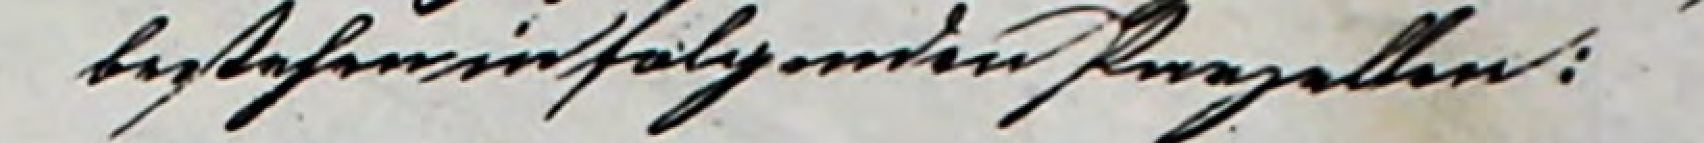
bestehen in folgenden Parzellen:
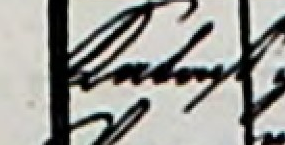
Katast
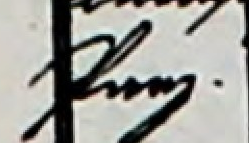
Parz.
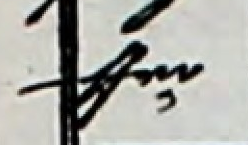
ffer
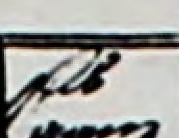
Ab
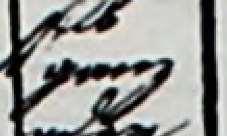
ganz
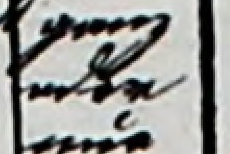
oder
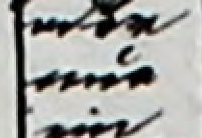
nur
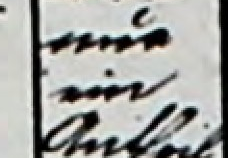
ein
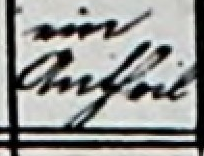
Antheil
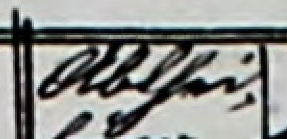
Abthei„
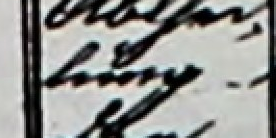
lung
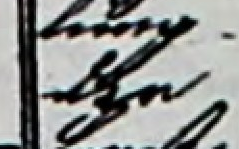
der
